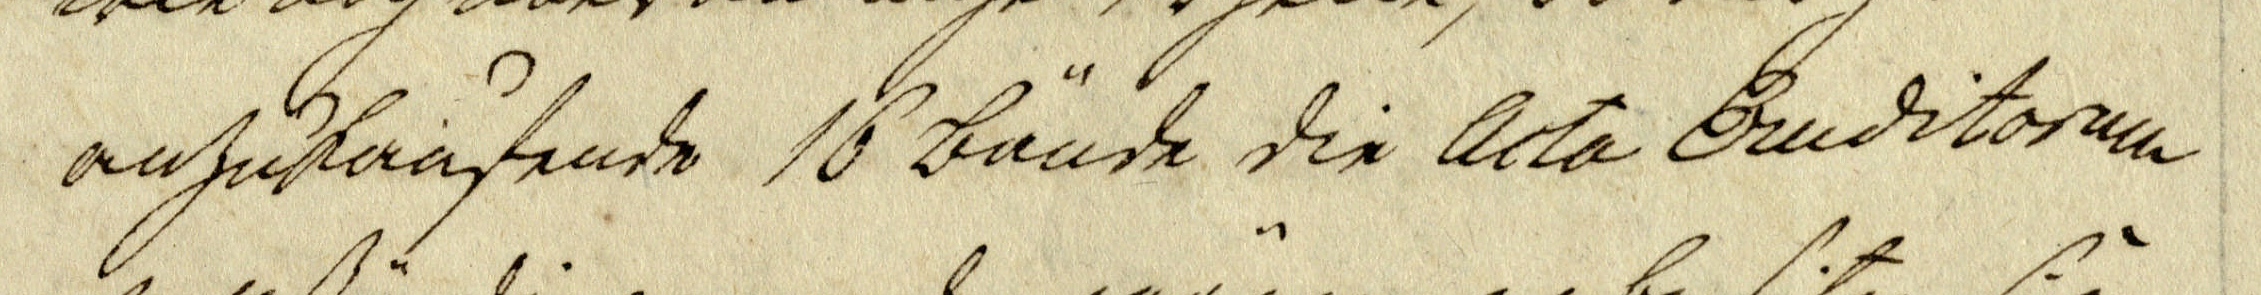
anzukaufende 16 Bände die Acta Eruditorum
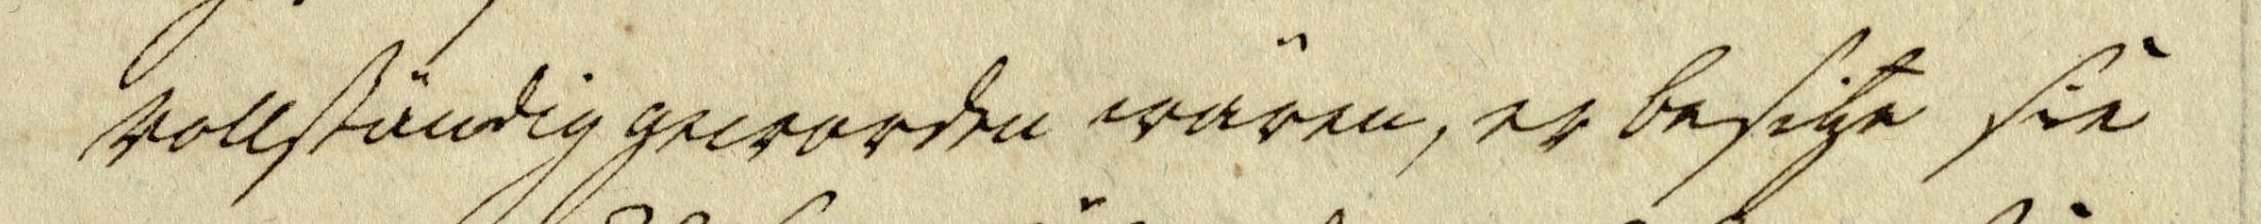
vollständig geworden wären, er besitze sie
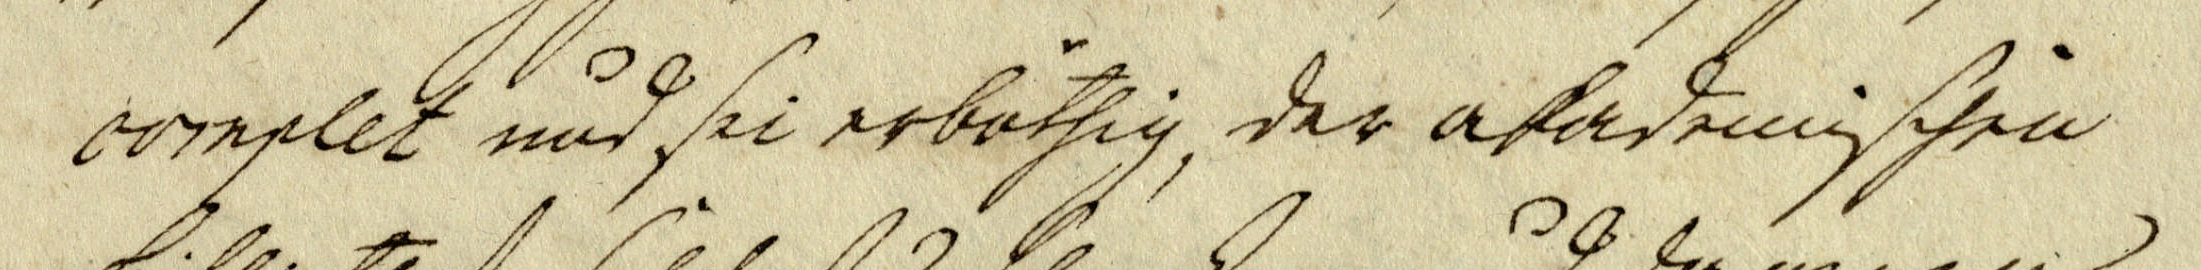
complet und sei erböthig, der akademischen
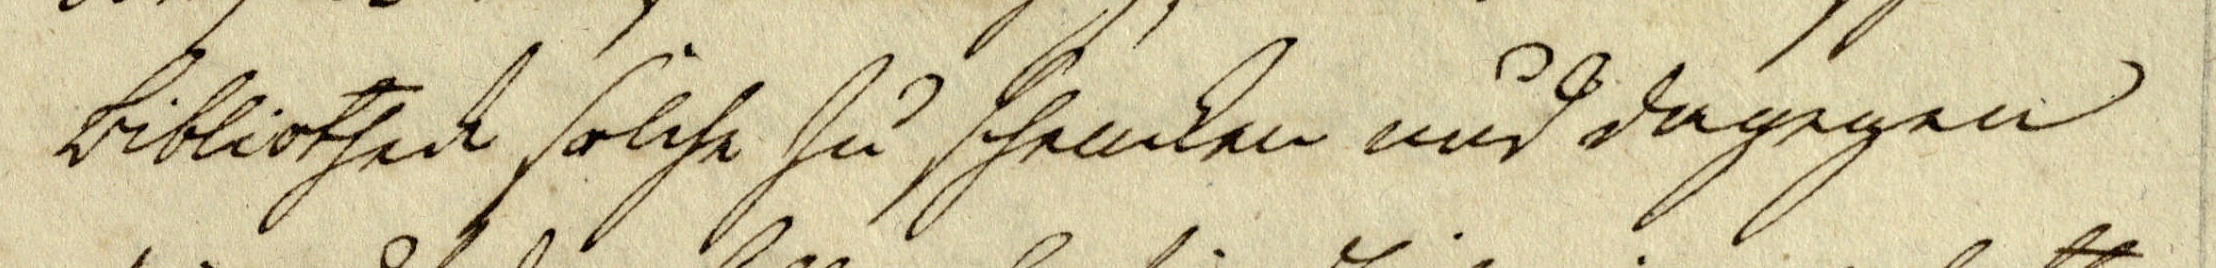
Bibliotheck solche zu schencken und dagegen
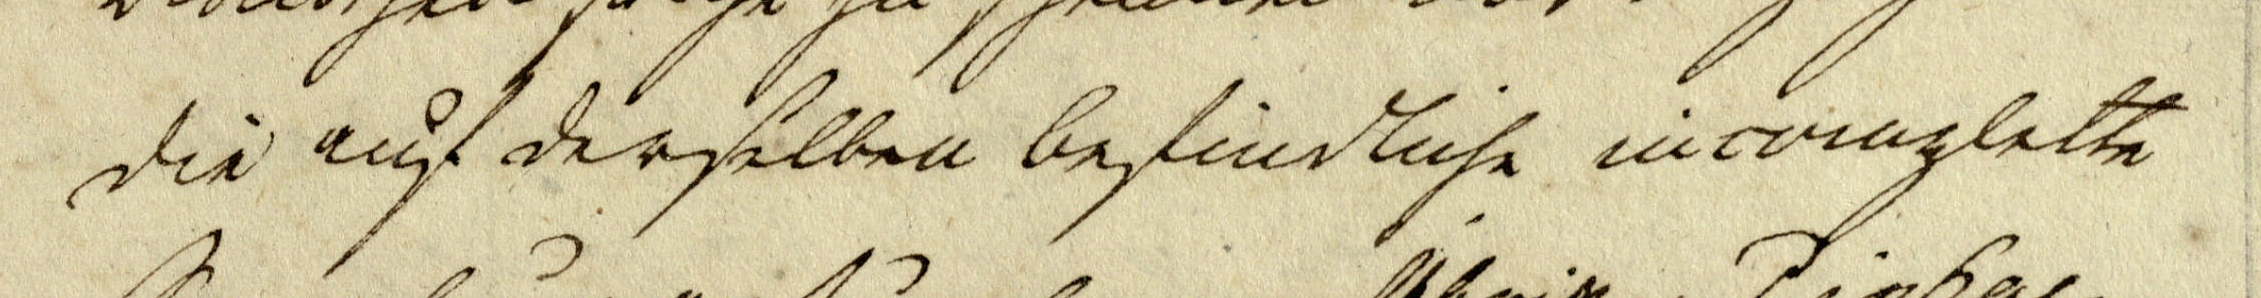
die auf derselben befindliche incomplette
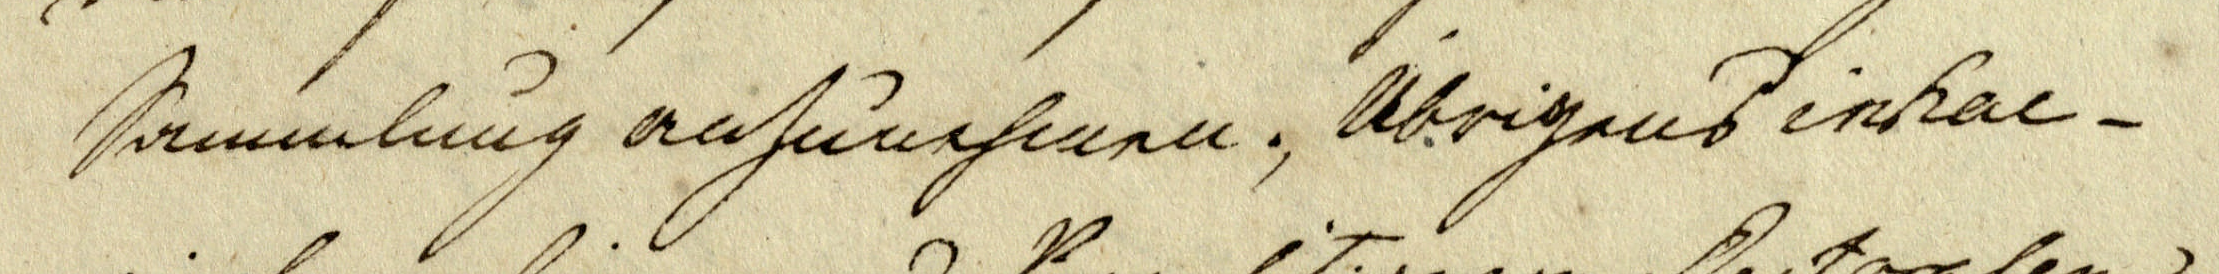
Sammlung anzunehmen; Übrigens inhae¬
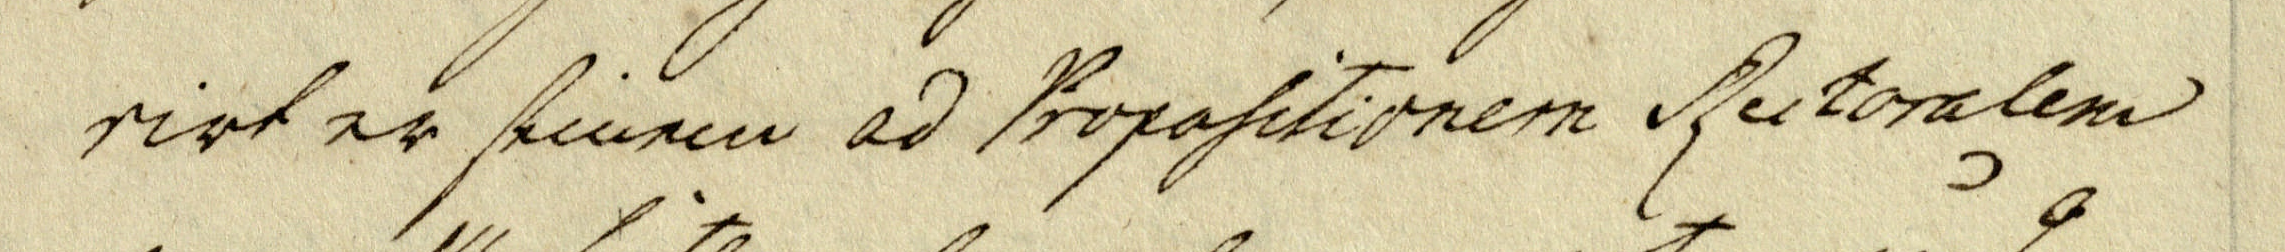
rirt er seinem ad Propositionem Rectoralem
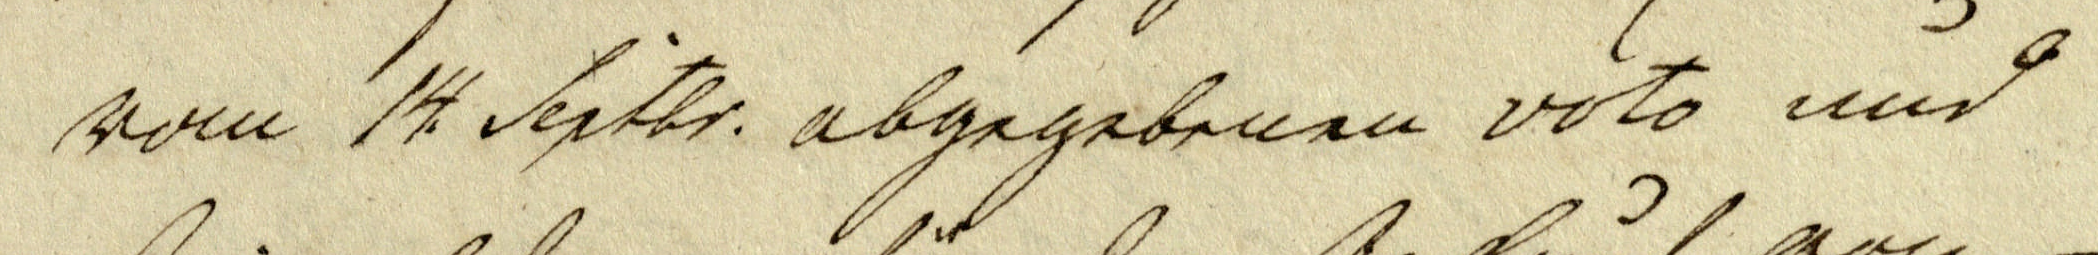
vom 14 Septbr. abgegebenen voto und
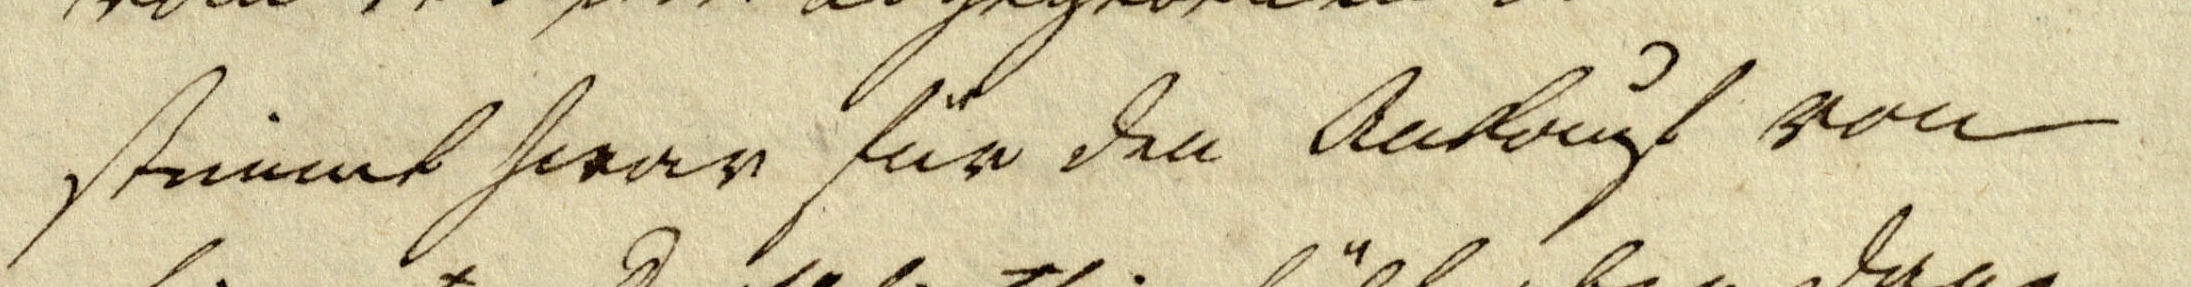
stimmt zwar für den Ankauf von
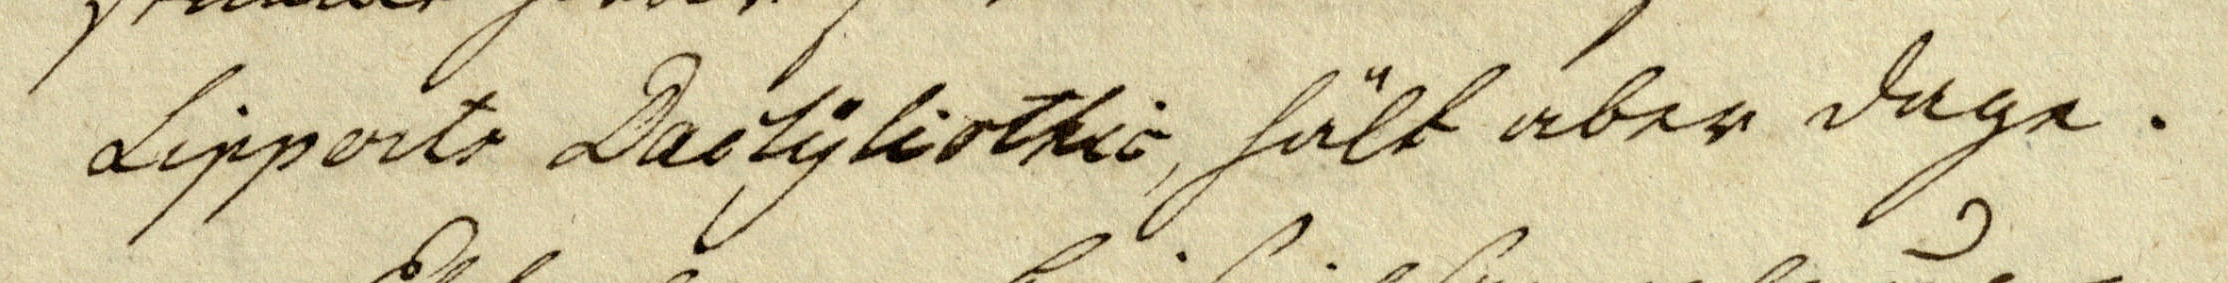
Lipperts Dactyliothec, hält aber dage¬
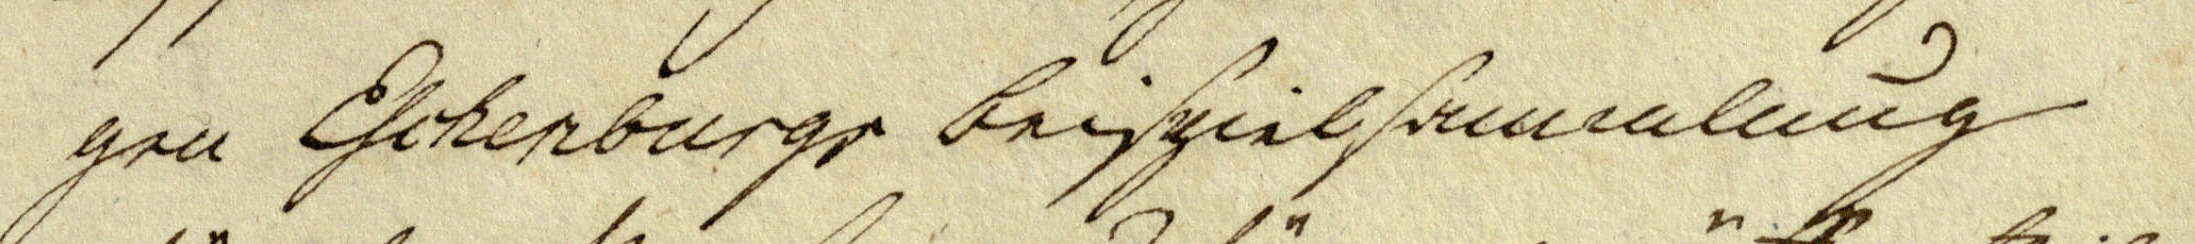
gen Eschenburgs Beispielsammlung
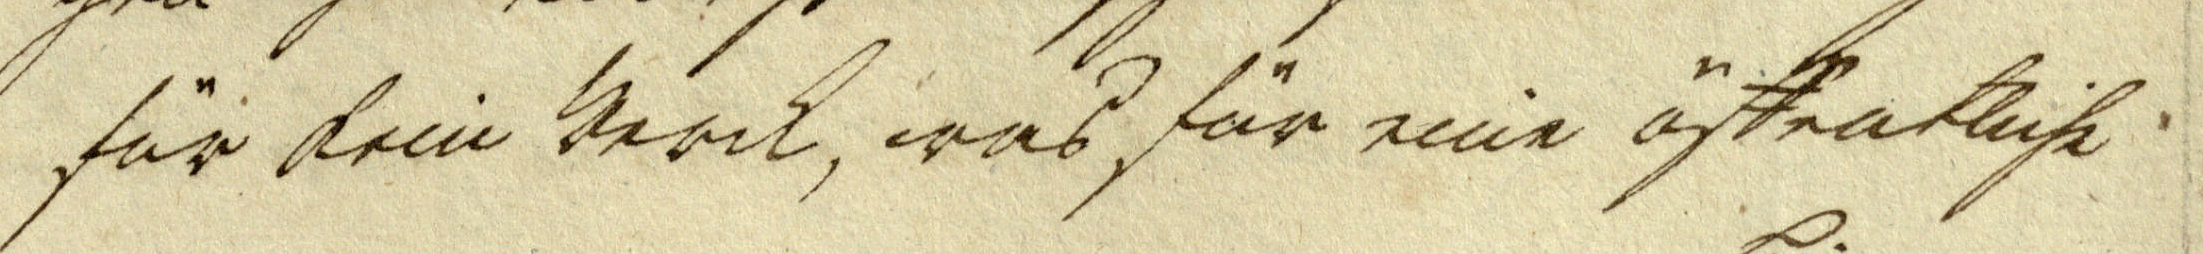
für kein Werck, was für eine öffentliche
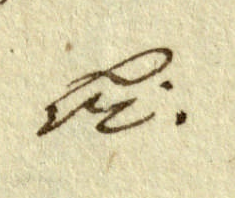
Bi
